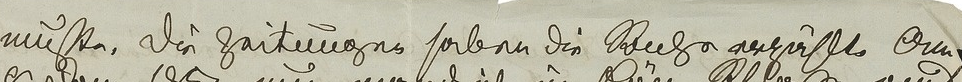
mußte. Die Zeitungen haben die Sache erzählt. Am
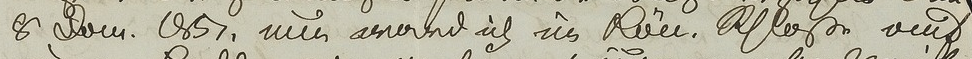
8 Jan. 1851. nun ward ich im kön. Schloße auf
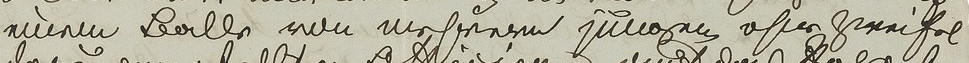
einem Balle von mehrern jungen, ohne Zweifel
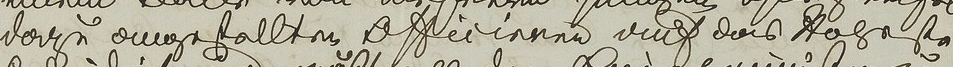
dazu angestellten Officieren auf das Roheste
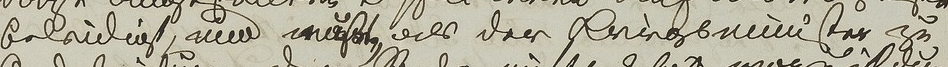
beleidigt, und mußte, als der Kriegsminister zu
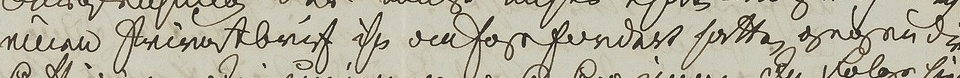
einen Privatbrief ihn aufgefordert hatte, gegen die
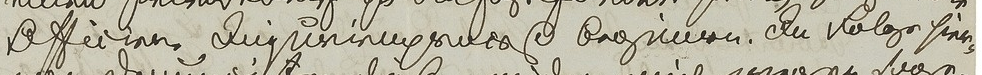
Officire Injurienproceß beginnen. In Folge hier-
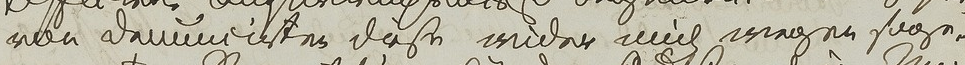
von denuncirten diese wider mich wegen soge-
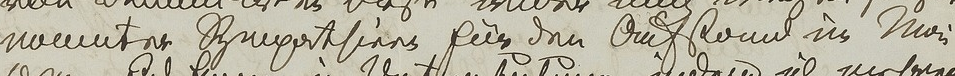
nannter Sympathien für den Aufstand im Mai
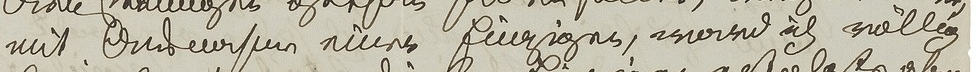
mit Ausnahme einer Einzigen, ward ich völlig
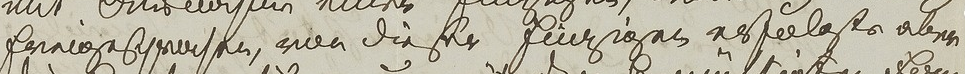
freigesprochen, von dieser Einzigen erfolgte aber
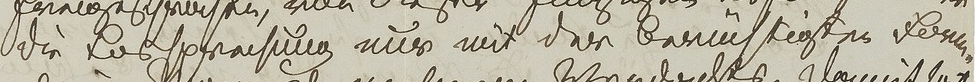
die Lossprechung nur mit der berüchtigten Form-
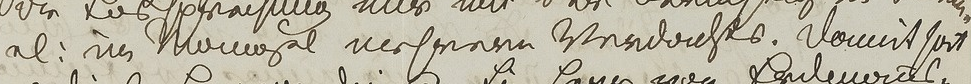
el: im Mangel mehrern Verdachts. Damit hat
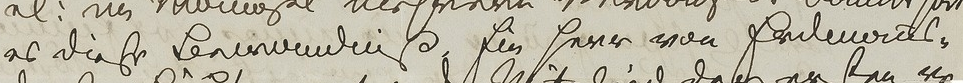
es diese Bewandniß. Ein Herr von Erdmanns-
